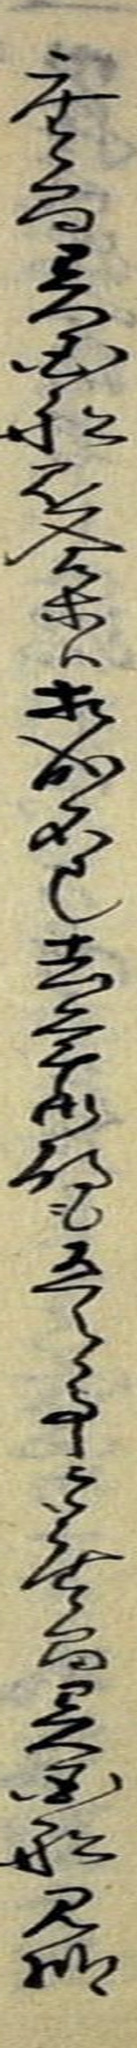座候間異国船懸合等ハ相成不申候去年御触も有之候事ニ御座候間異国船見掛候
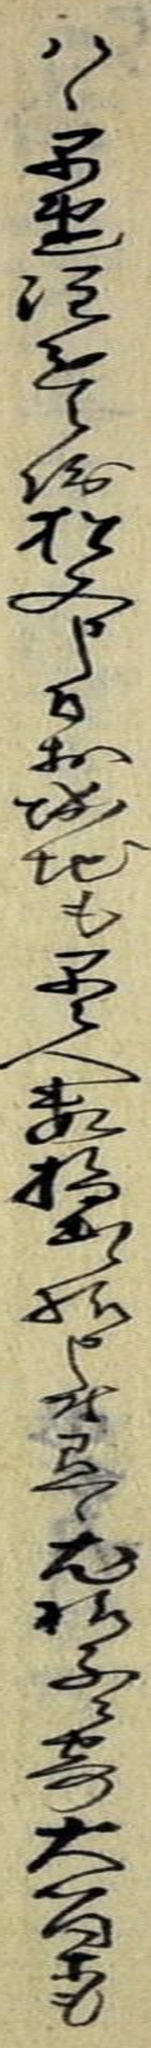ハヽ早速注進之儀猶又申付於城地も早々人数指出候様申付置候尤様子ニ寄大筒等も
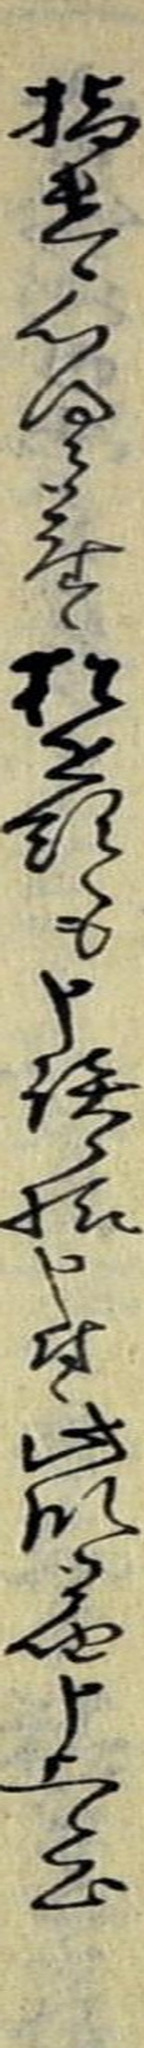指遣候心得ニ御座候猶近領へも申談候様申付候此段御届申上候以上正月廿一日
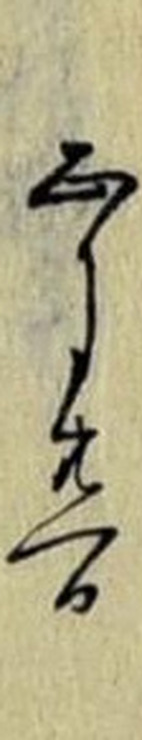二月廿四日
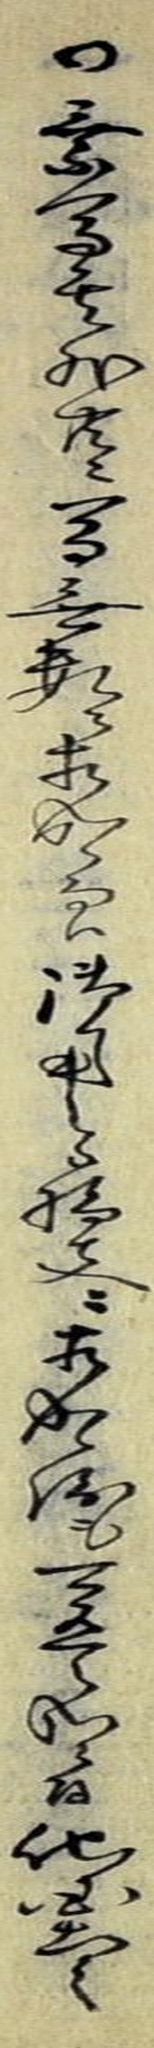〇乗馬其外共ニ馬無数ニ相成候而ハ御用之御指支ニ相成候儀も可有之哉ニ付他国出之
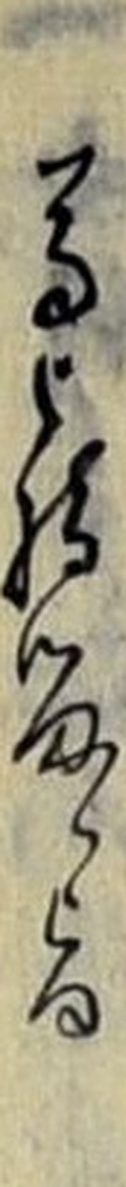馬被指留候旨
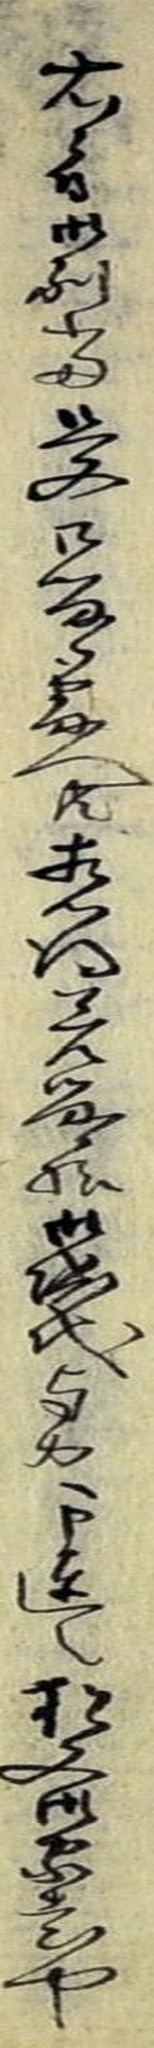右ニ付御別当且又口留御番人共相心得差留候様御城代与力へ申達之猶又御家老中
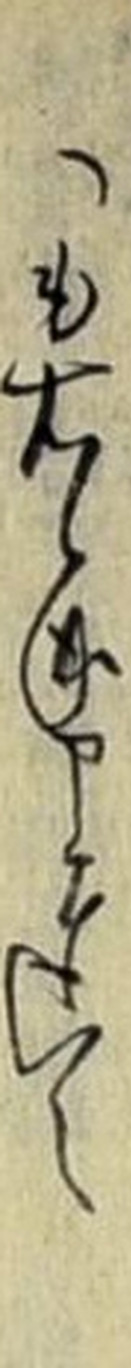へも右之趣申達之
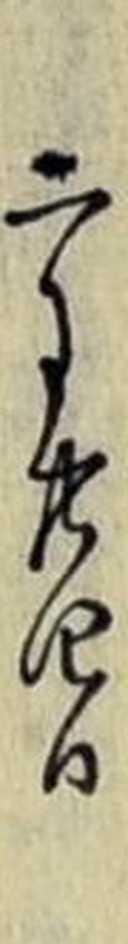二月廿四日
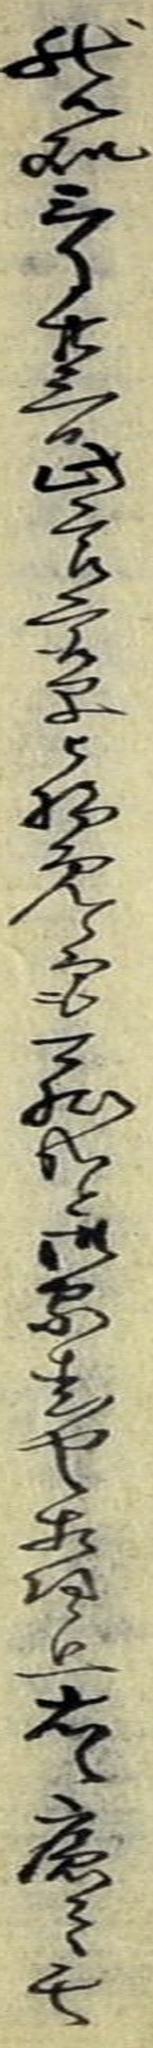然ル処三月廿三日此節最早被指免候而も可然哉と御家老中へ相伺候上右之廉々へ其
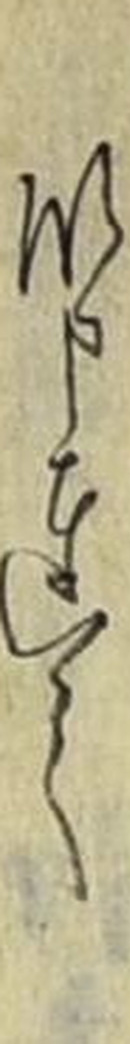段申達之
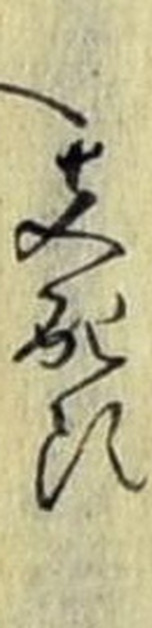支配頭
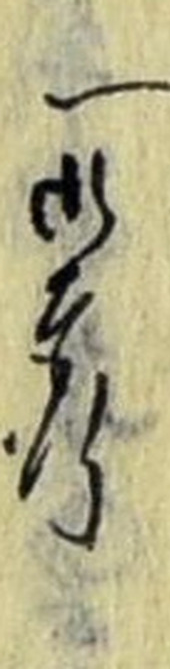御奉行

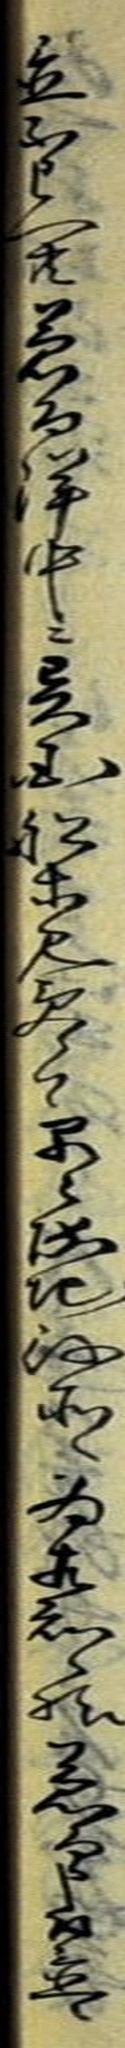置不申候へ共兼而洋中ニ異国船等見受候ハヽ早々御城役所へ為相知候様兼而申付置候
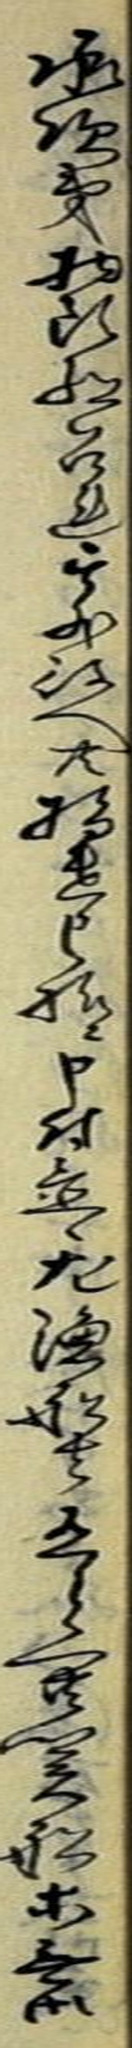承次第物頭組召連其外役人共指遣申様ニ申付置候尤漁船者有之候へ共関船等無御

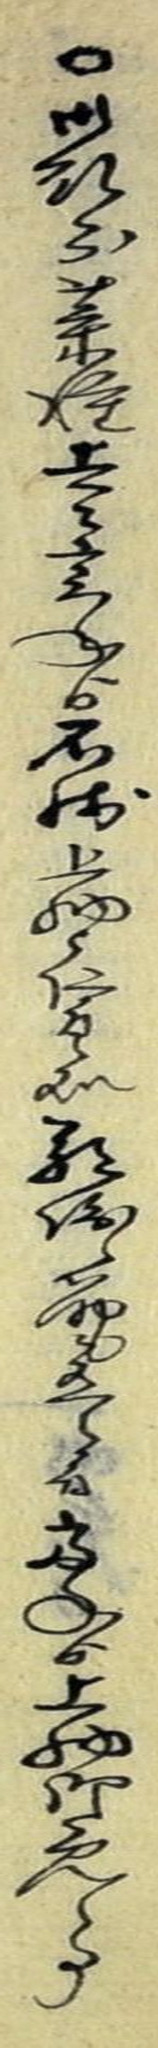〇御領分薬種去々亥年ゟ不残上納被仰付候処難儀之筋有之ニ付当年ゟ上納御免候事
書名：命令之部 三
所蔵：福井県文書館 Fukui Prefectural Archives
